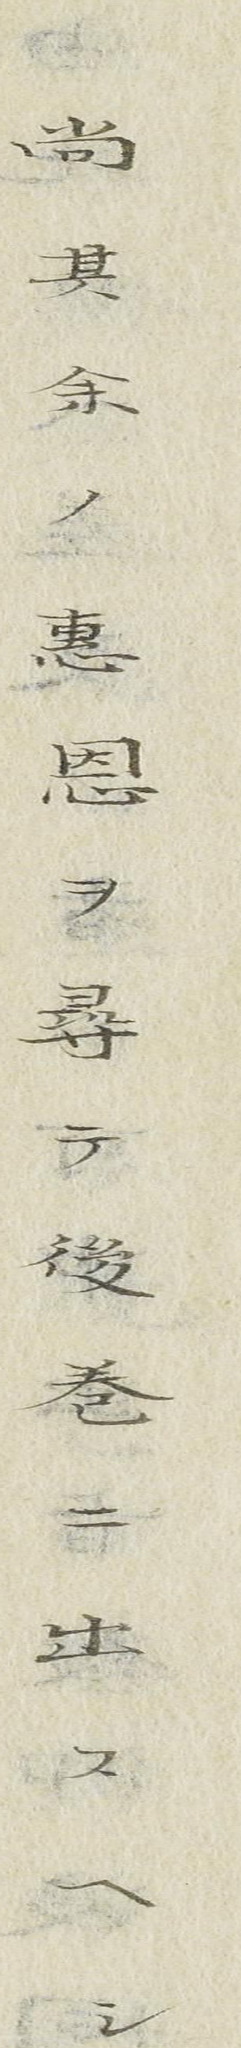尚其余ノ恵恩ヲ尋テ後巻ニ出スヘシ
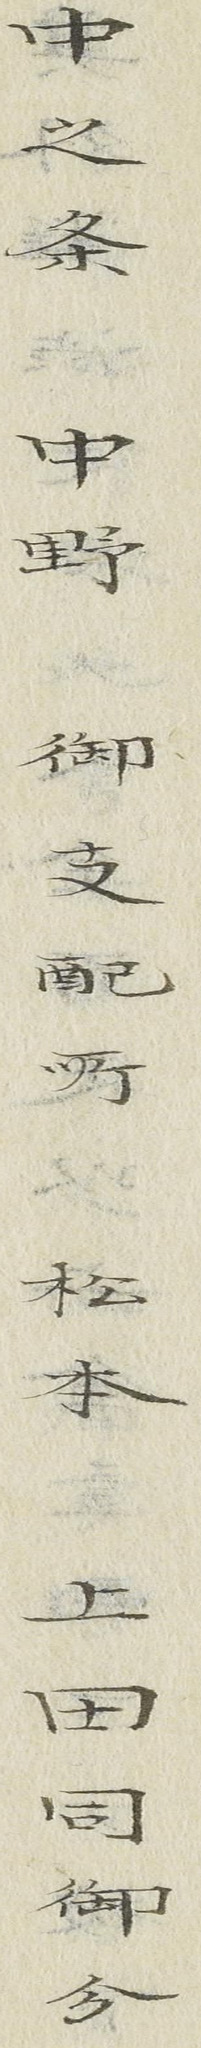中之条中野御支配所松本上田同御分
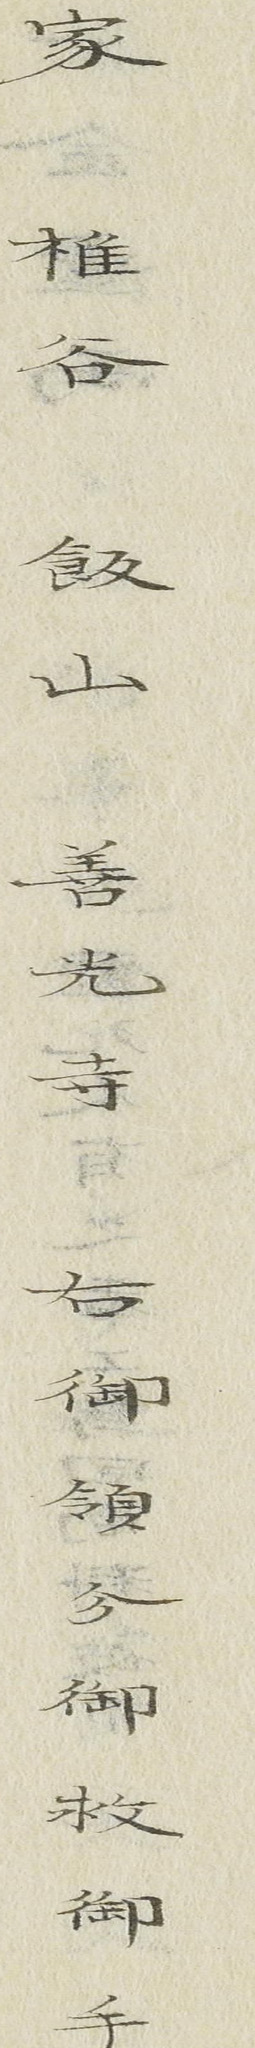家椎谷飯山善光寺右御領分御救御手
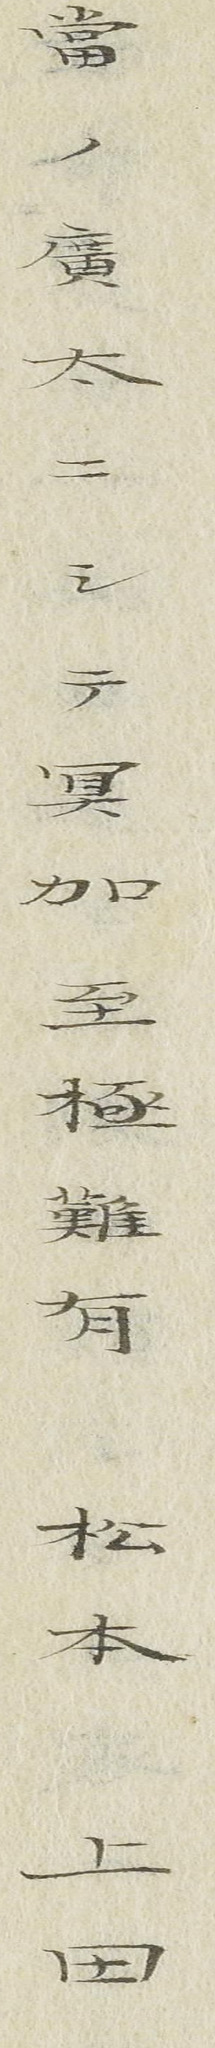当ノ広太ニシテ冥加至極難有松本上田
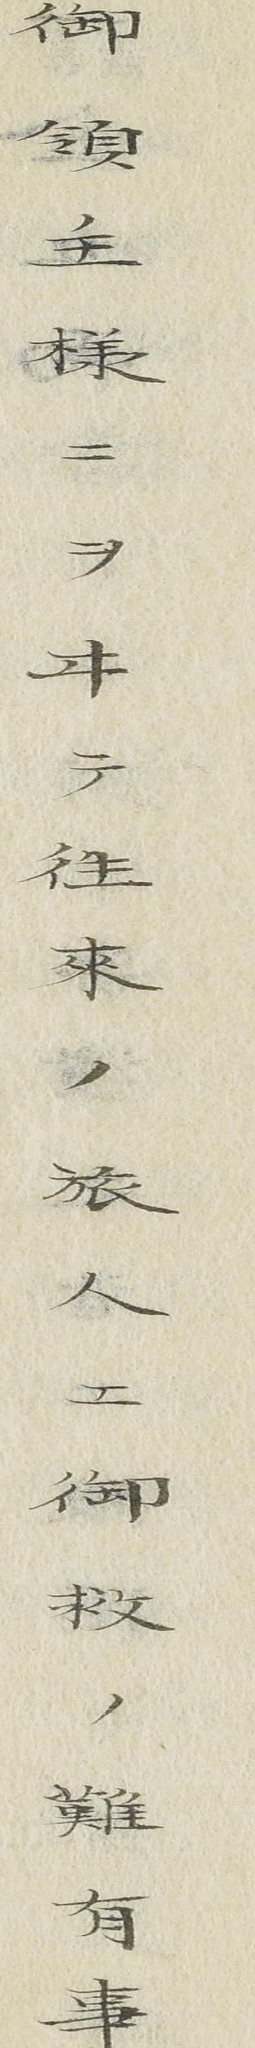御領主様ニヲヰテ往来ノ旅人エ御救ノ難有事
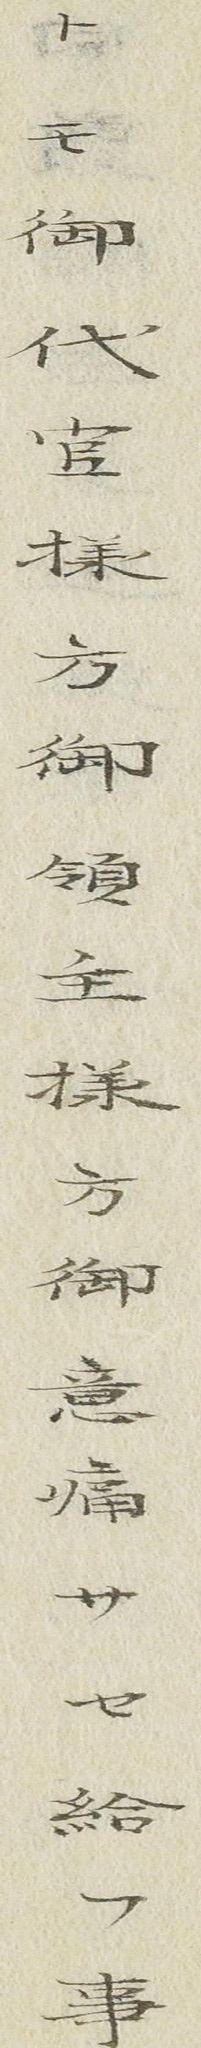トモ御代官様方御領主様方御意痛サセ給フ事
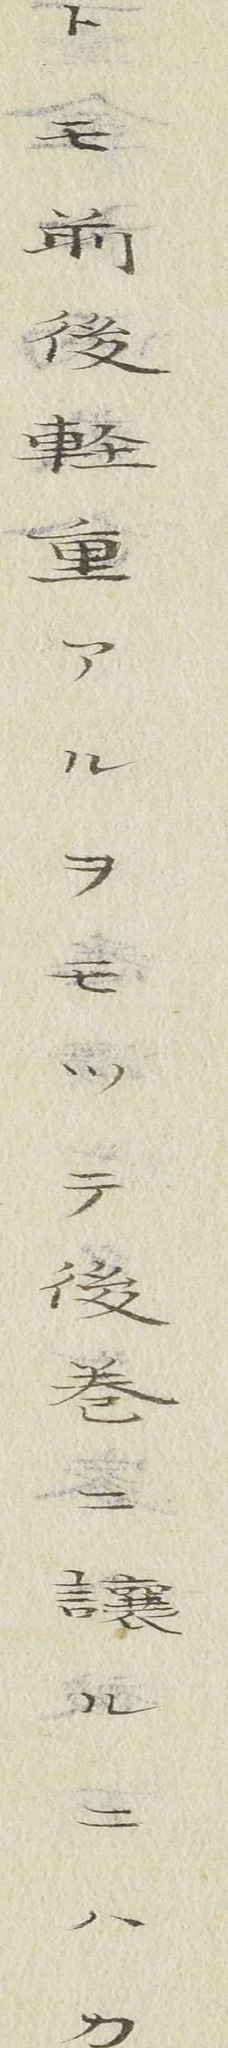トモ前後軽重アルヲモツテ後巻ニ譲ルニハカ
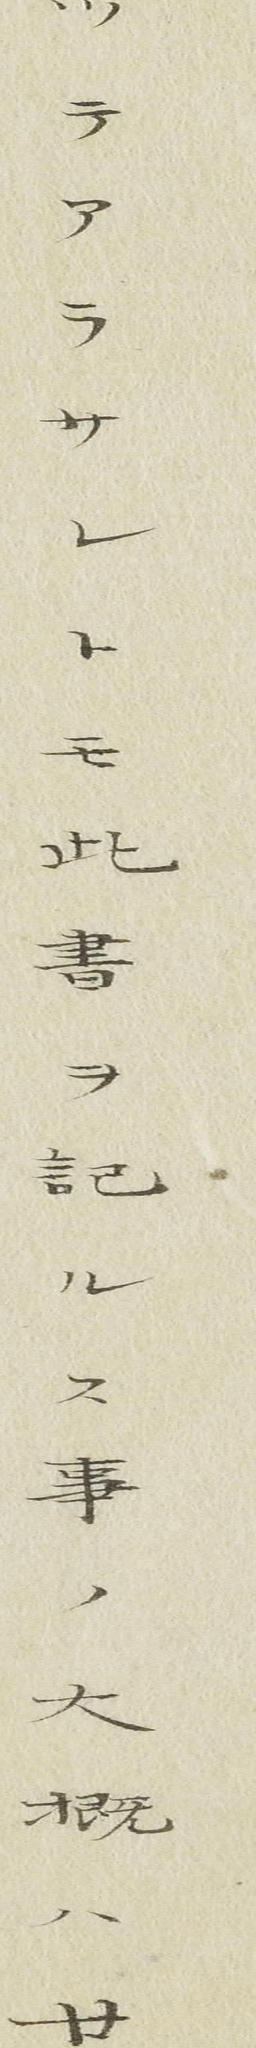ツテアラサレトモ此書ヲ記ルス事ノ大概ハ廿
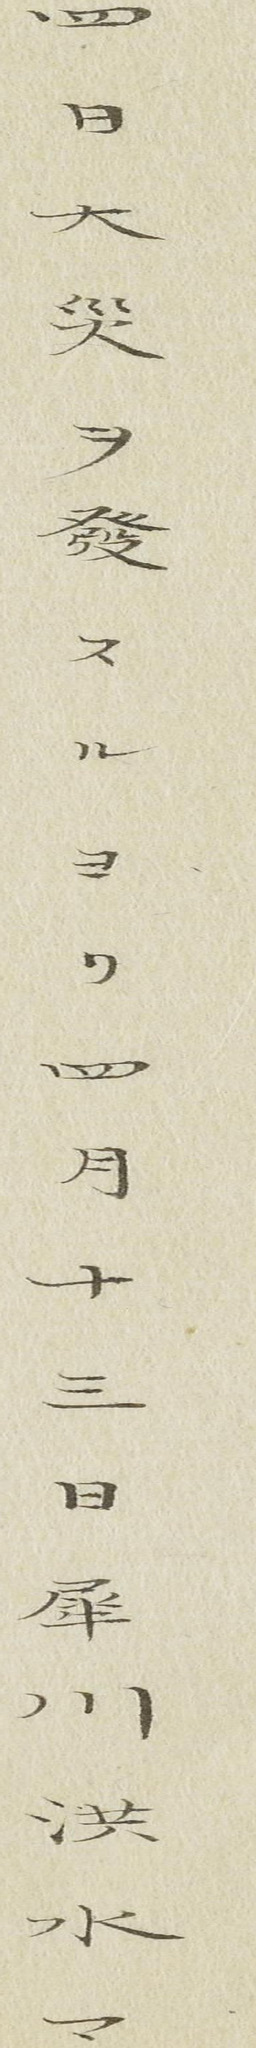四日大災ヲ発スルヨリ四月十三日犀川洪水マ
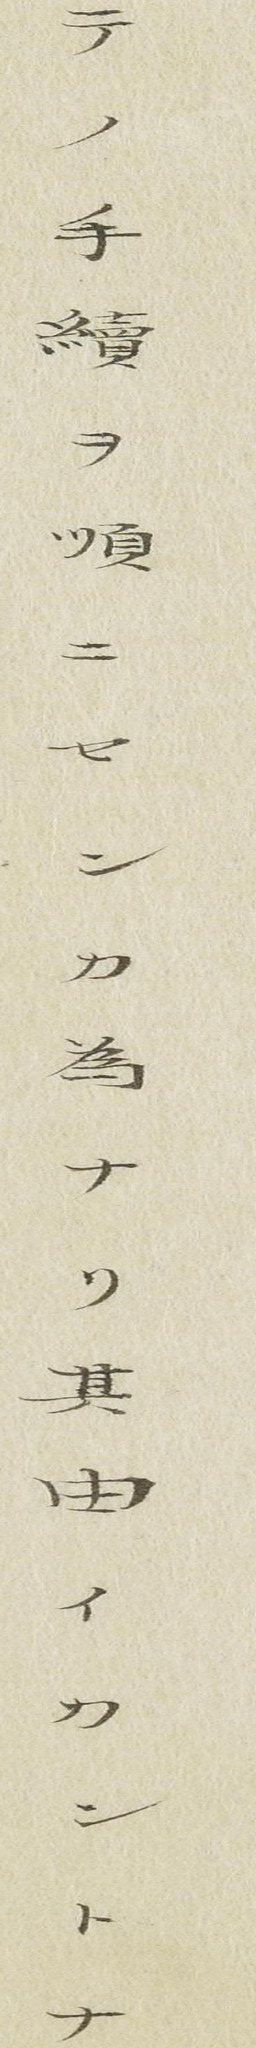テノ手続ヲ順ニセンカ為ナリ其由イカントナ
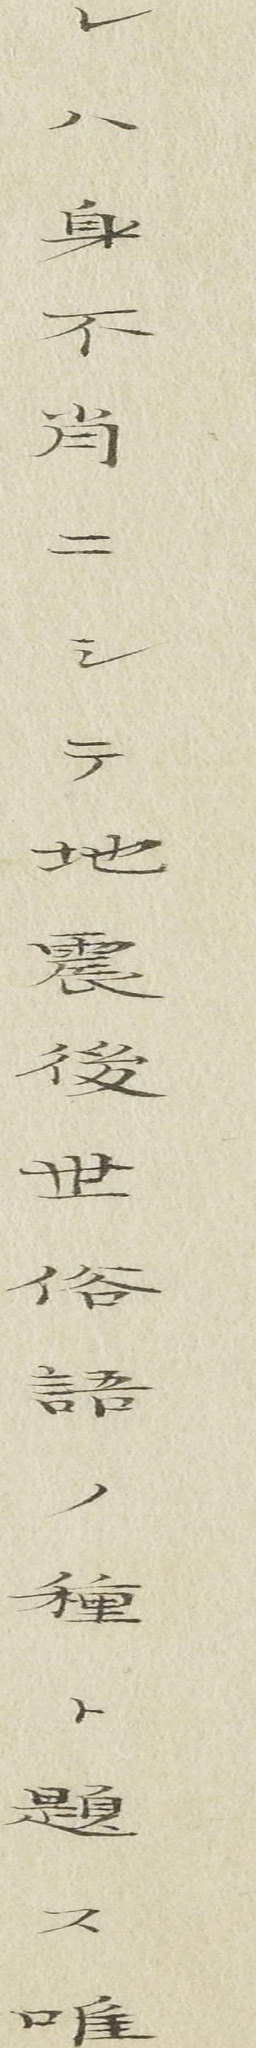レハ身不肖ニシテ地震後世俗語ノ種ト題ス唯
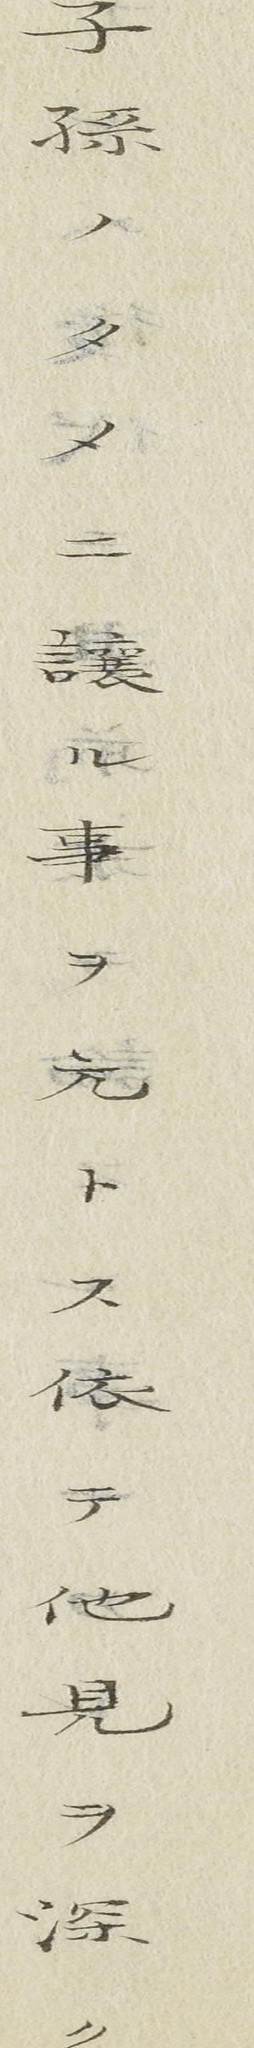子孫ノタメニ譲ル事ヲ元トス依テ他見ヲ深ク
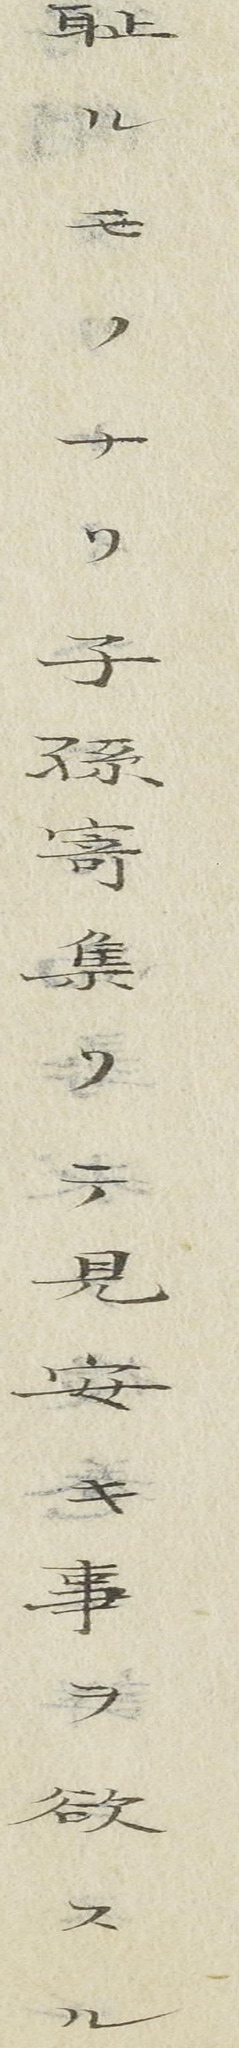恥ルモノナリ子孫寄集リテ見安キ事ヲ欲スル
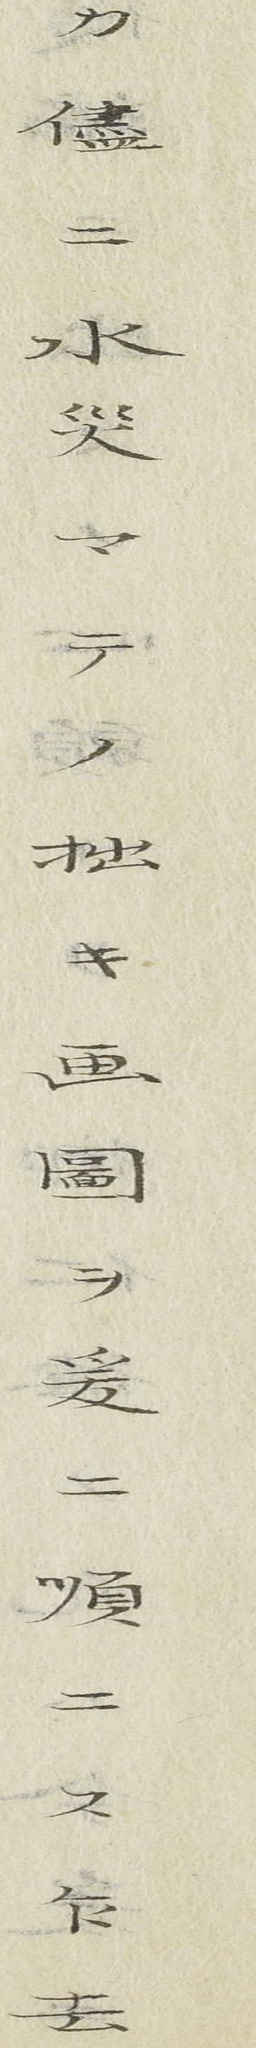カ侭ニ水災マテノ拙キ画図ヲ爰ニ順ニス乍去
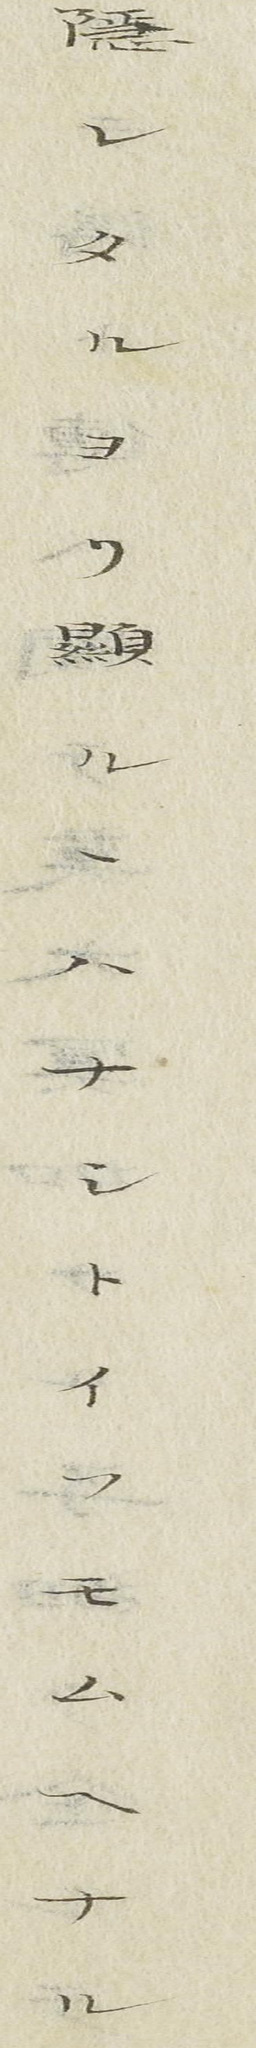隠レタルヨリ顕ルヽハナシトイフモムヘナル
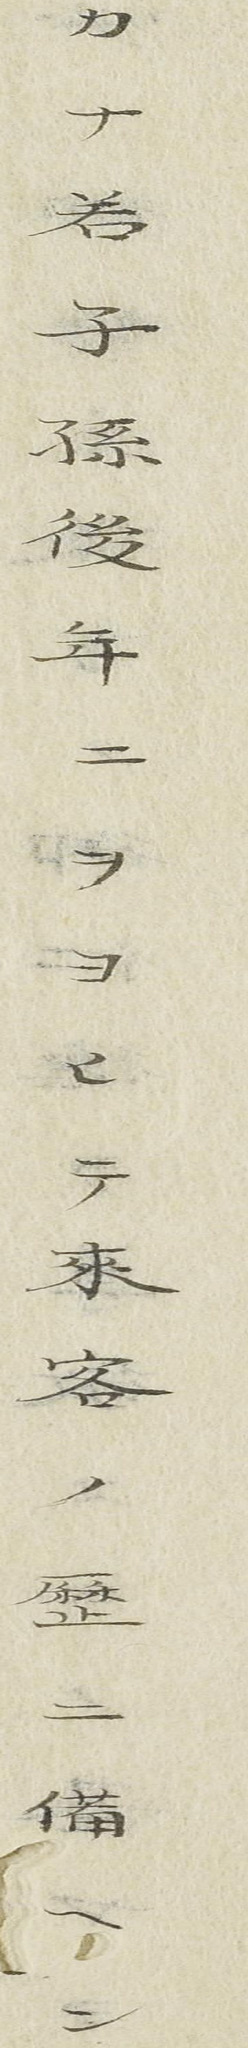カナ若子孫後年ニヲヨヒテ来客ノ歴ニ備ヘン
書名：地災撮要　地震之部　巻ノ二
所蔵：東京大学地震研究所図書室 Earthquake Research Institute Library, The University of Tokyo, JAPAN
